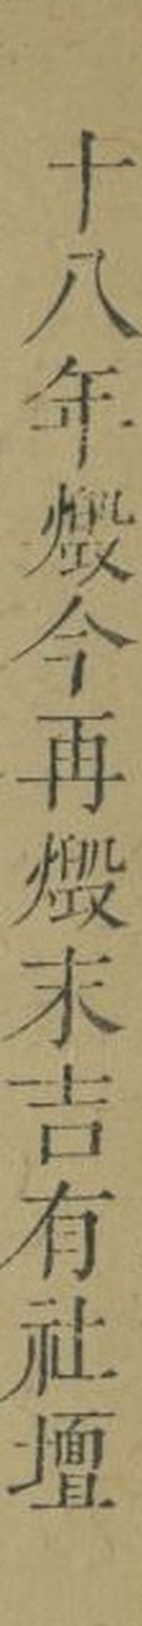十八年燬今再燬末吉有社壇
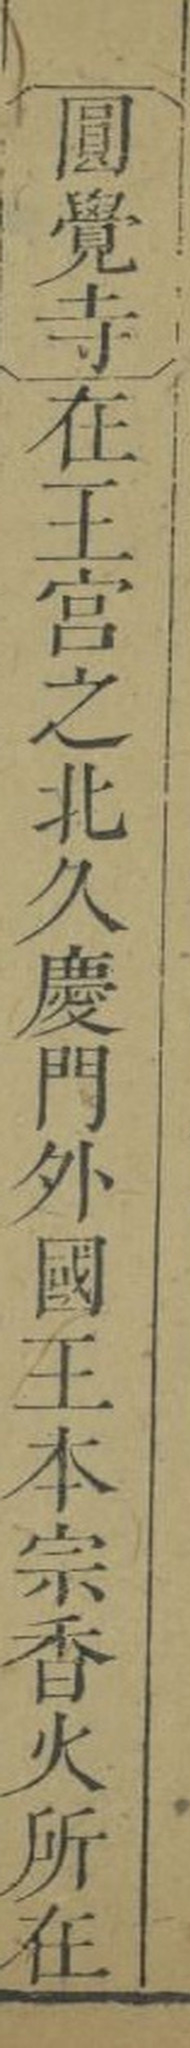[円覚寺]在王宮之北久慶門外国王本宗香火所在
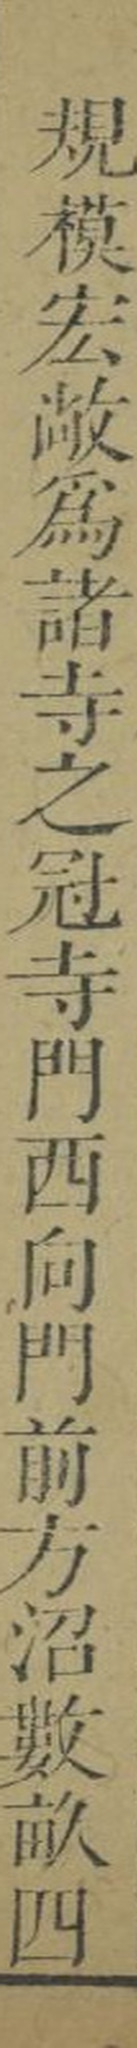規模宏敞為諸寺之冠寺門西向門前方沼数畝四
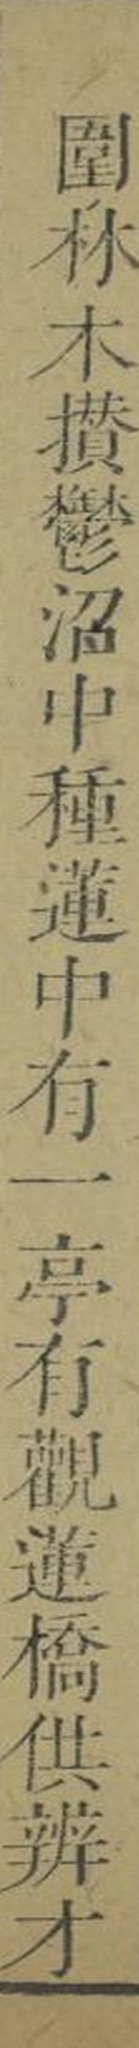囲林木攢鬱沼中種蓮中有一亭有観蓮橋供弁才
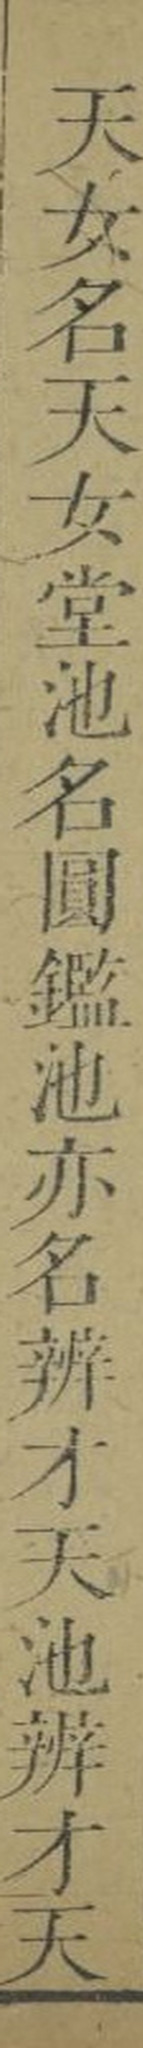天女名天女堂池名円鑑池亦名弁才天池弁才天
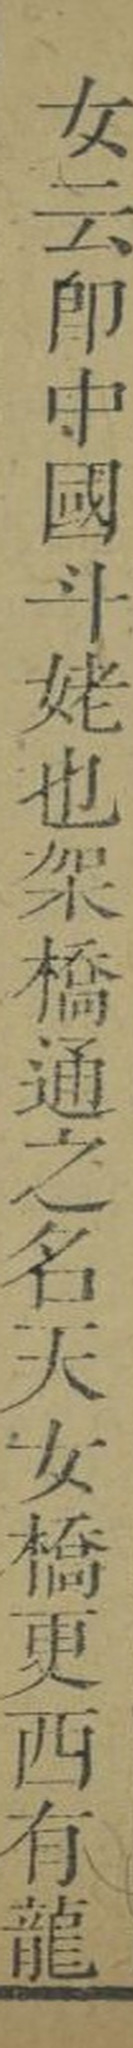女云即中国斗姥也架橋通之名天女橋更西有竜
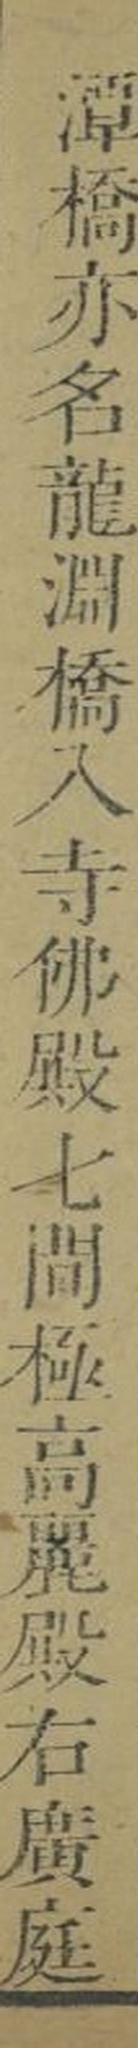潭橋亦名竜淵橋入寺仏殿七間極高麗殿右広庭
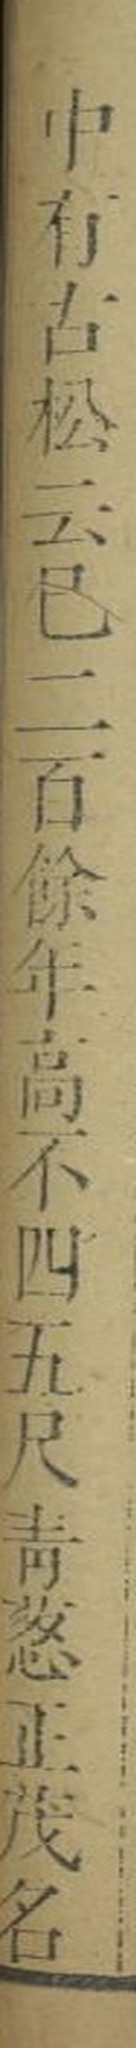中有古松云巳二百余年高不四五尺青葱正茂名
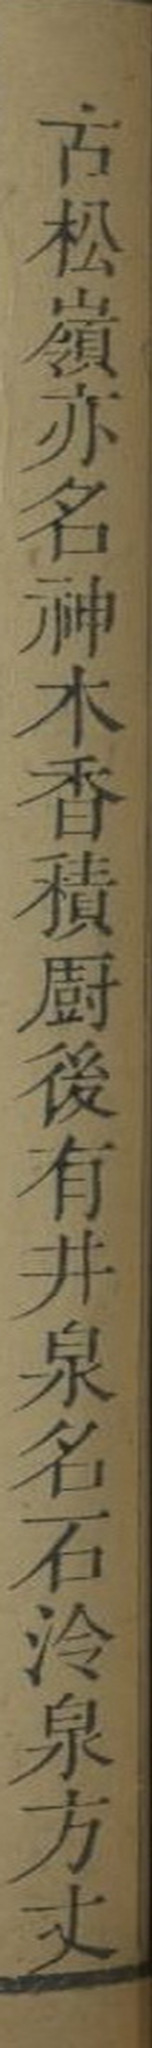古松嶺亦名神木香積厨後有井泉名石泠泉方丈
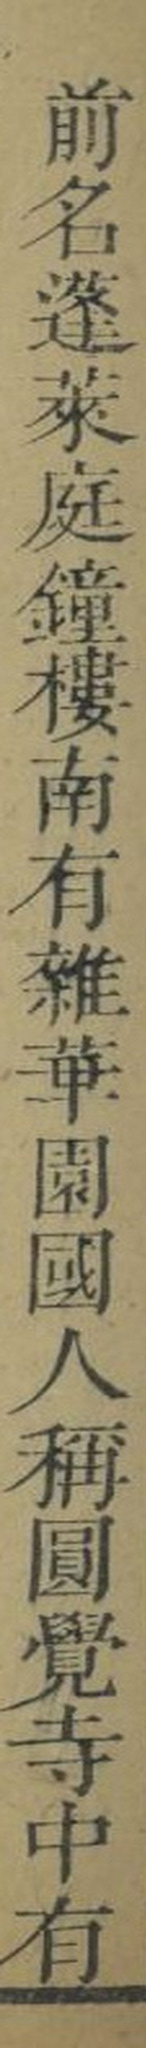前名蓬莱庭鐘楼南有雑華園国人称円覚寺中有
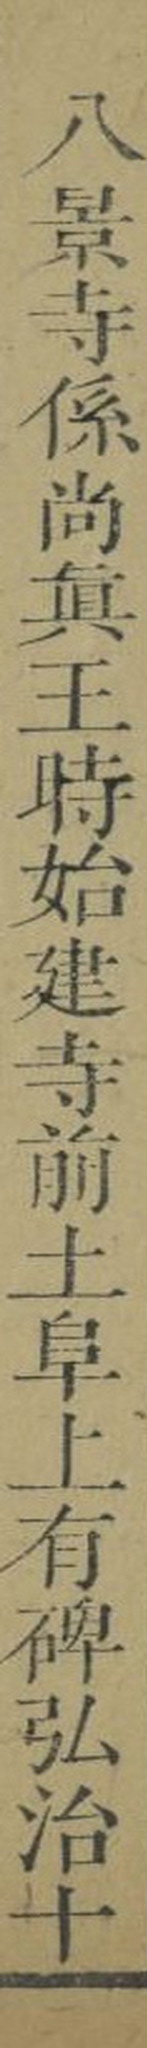八景寺係尚真王時始建寺前土阜上有碑弘治十

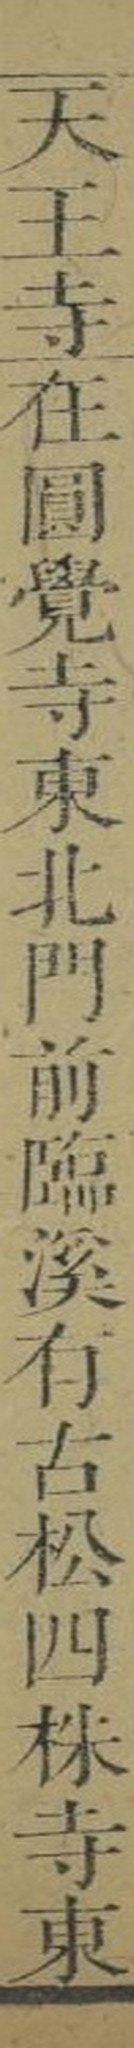[天王寺]在円覚寺東北門前臨渓有古松四株寺東
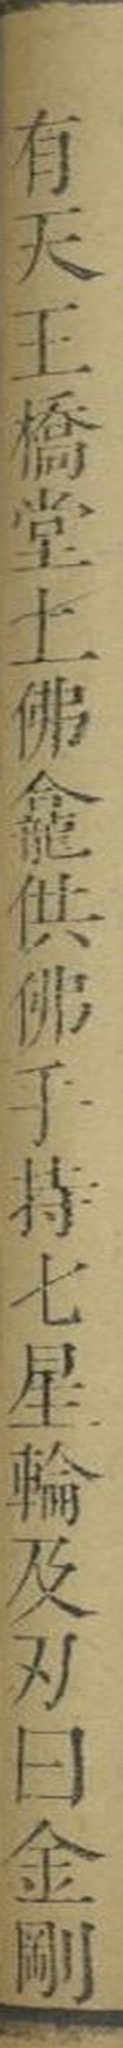有天王橋堂上仏龕供仏手持七星輪及刃曰金剛
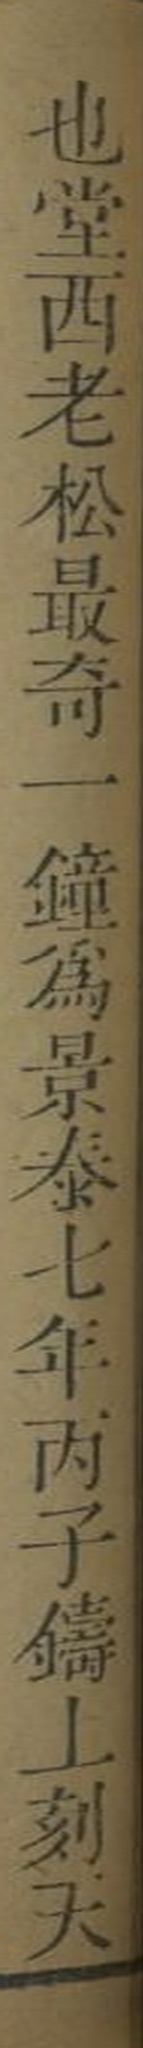也堂西老松最奇一鐘為景泰七年丙子鋳上刻天
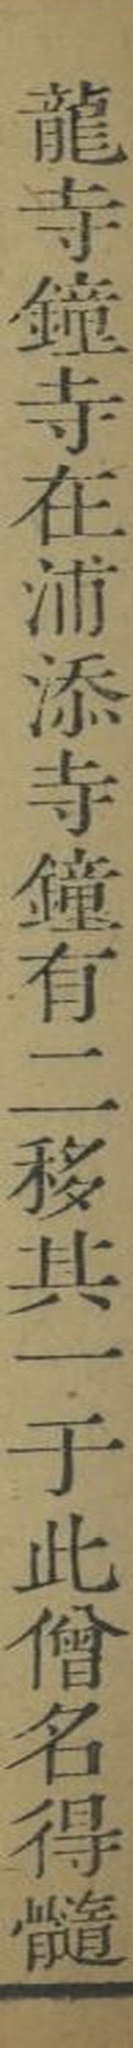竜寺鐘寺在浦添寺鐘有二移其一于此僧名得髄
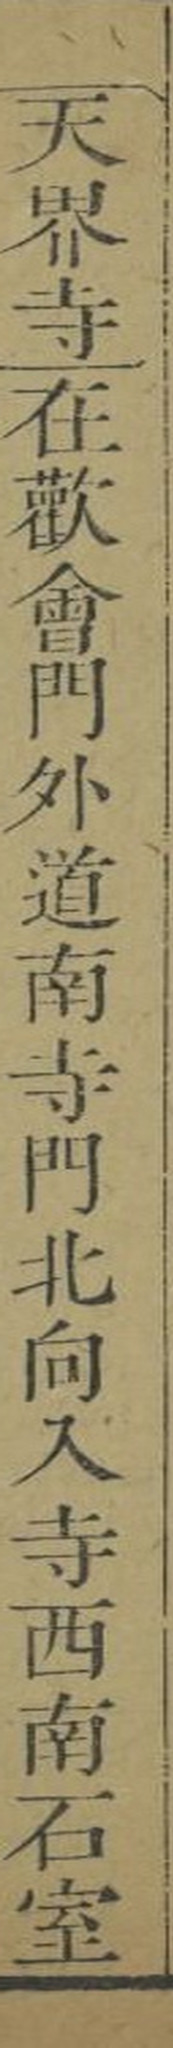[天界寺]在歓会門外道南寺門北向入寺西南石室
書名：中山伝信録 巻四
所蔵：University of the Ryukyus Library
